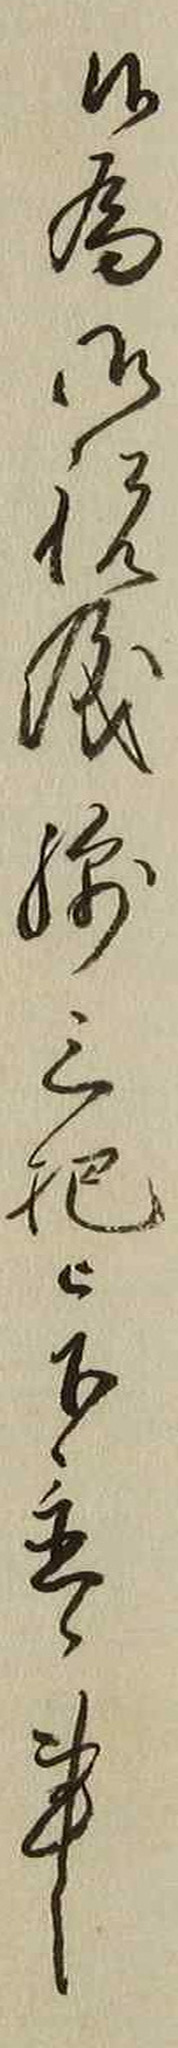候為御祝儀綿三把被下置候事
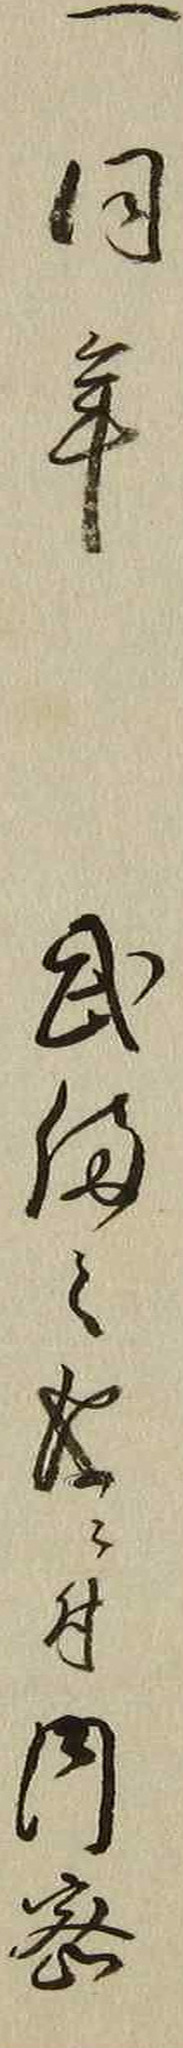一同年武備の儀に付内密
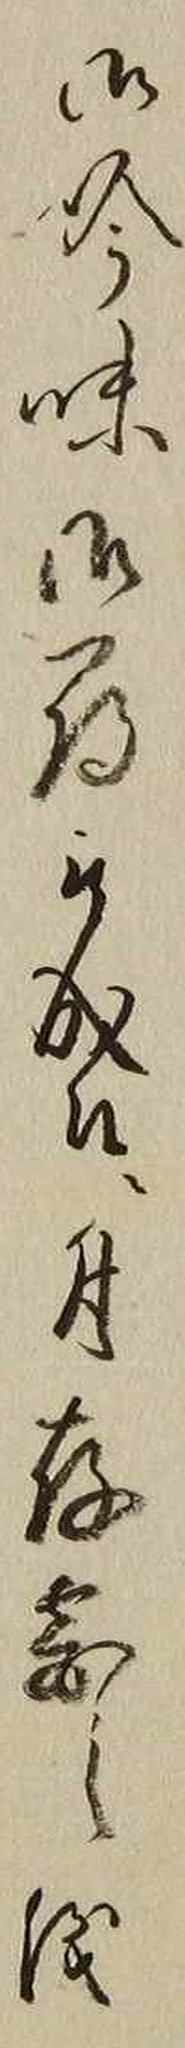御吟味御尋被成候に付存寄の儀
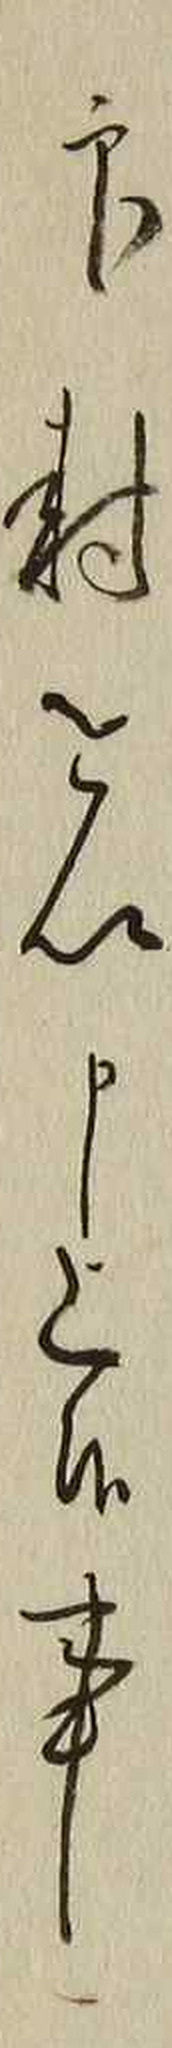印封を以申上候事
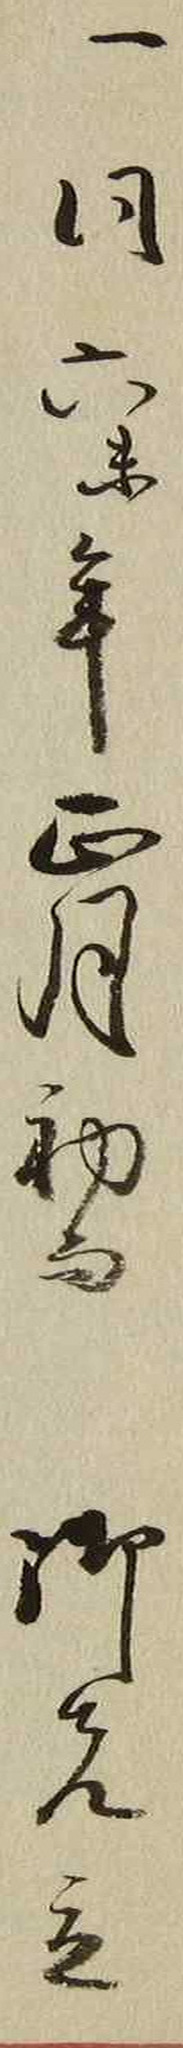一同六未年正月初而御先立
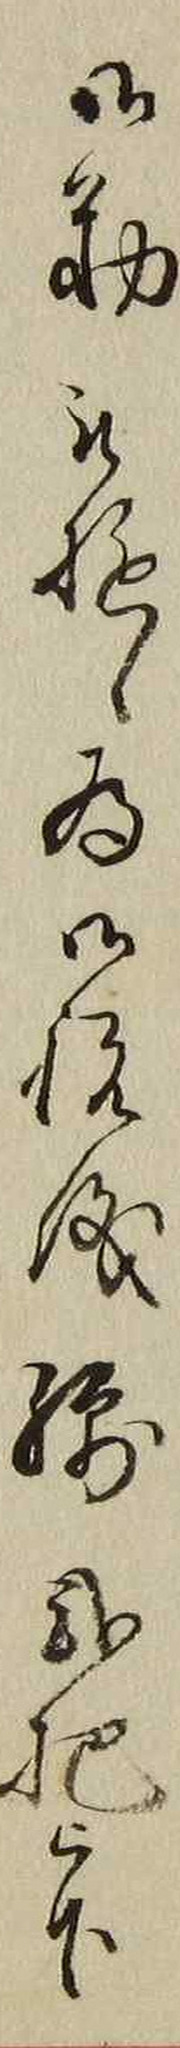御勤被遊候為御祝儀綿弐把被下
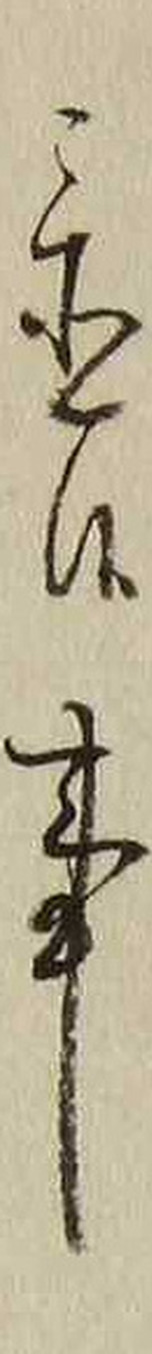置候事
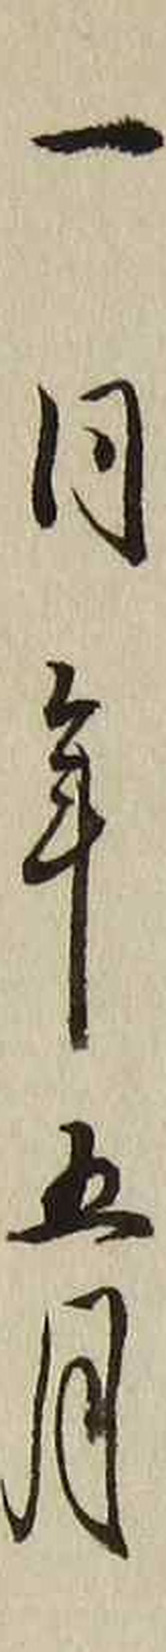一同年五月
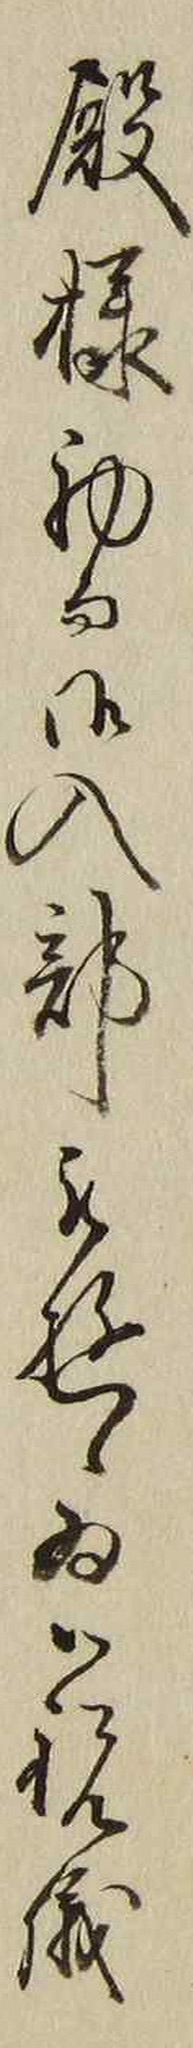殿様初而御入部被遊候為御祝儀
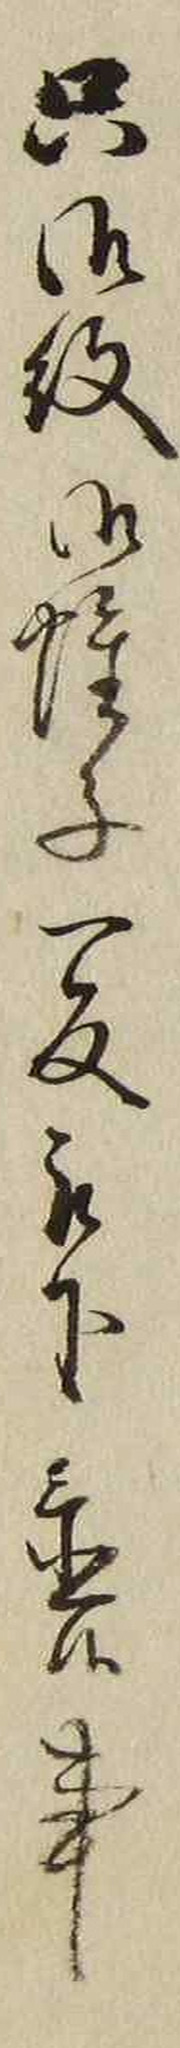只御紋御帷子一反被下置候事

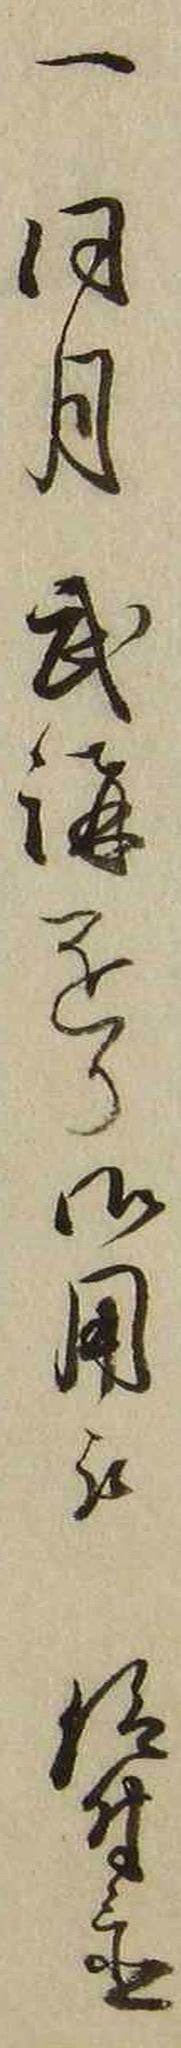一同月武講懸り御用被仰付置
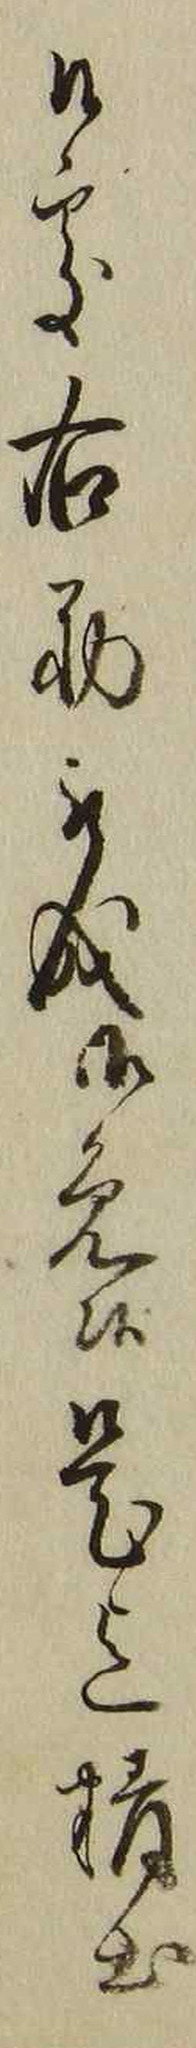候処右勤被成御免候是迄精出
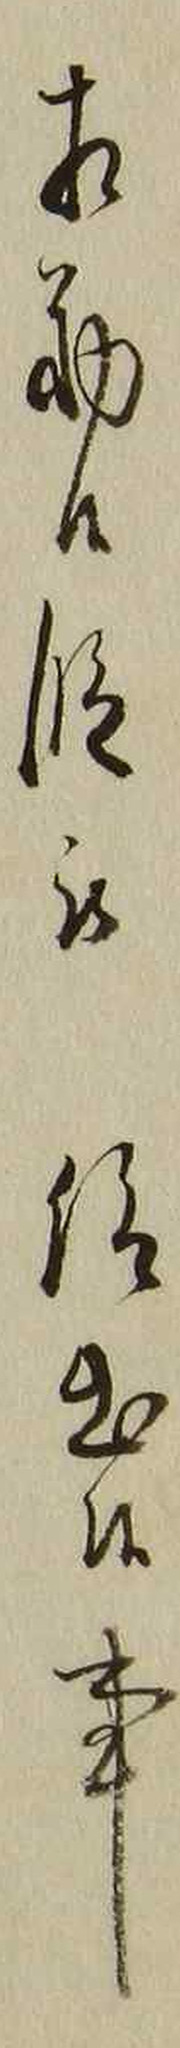相勤候段被仰出候事
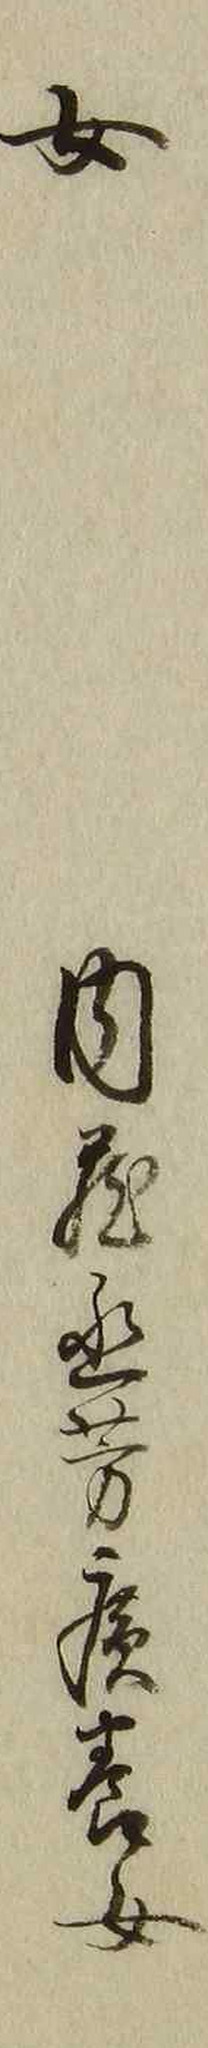女内蔵丞芳広養女
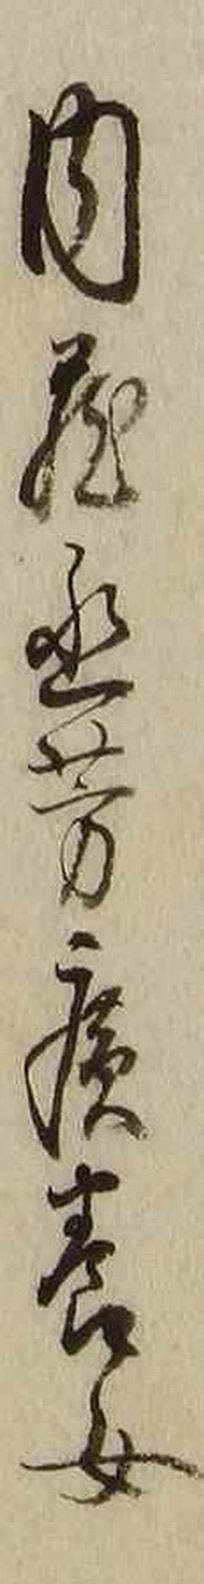女内蔵丞芳広養女
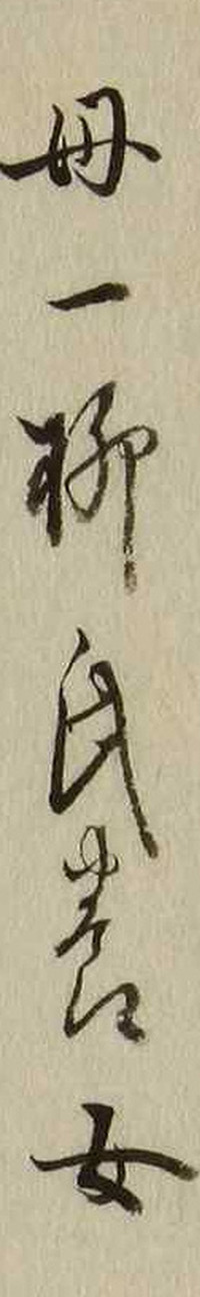母一柳氏養女
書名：諸士系譜　巻之1　い之部1
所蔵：会津若松市立会津図書館
